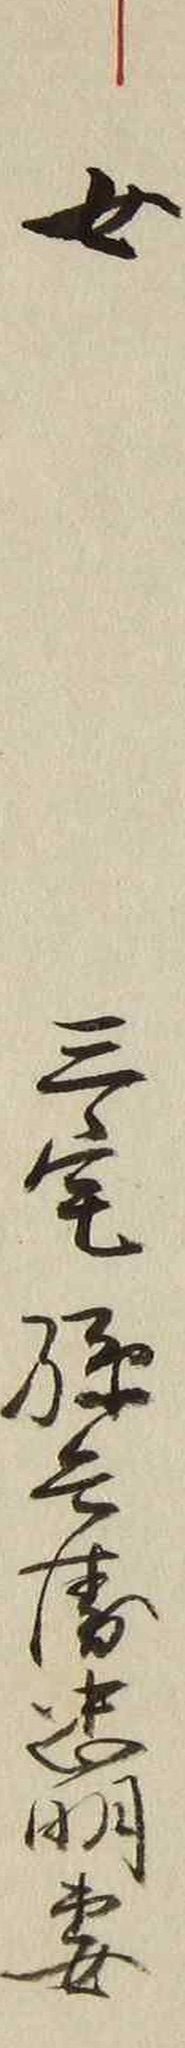女三宅孫兵衛忠明妻
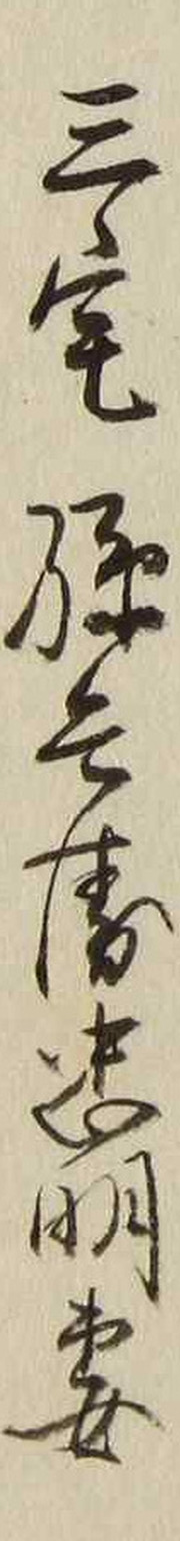女三宅孫兵衛忠明妻
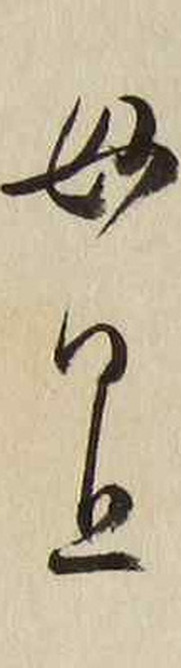母同上

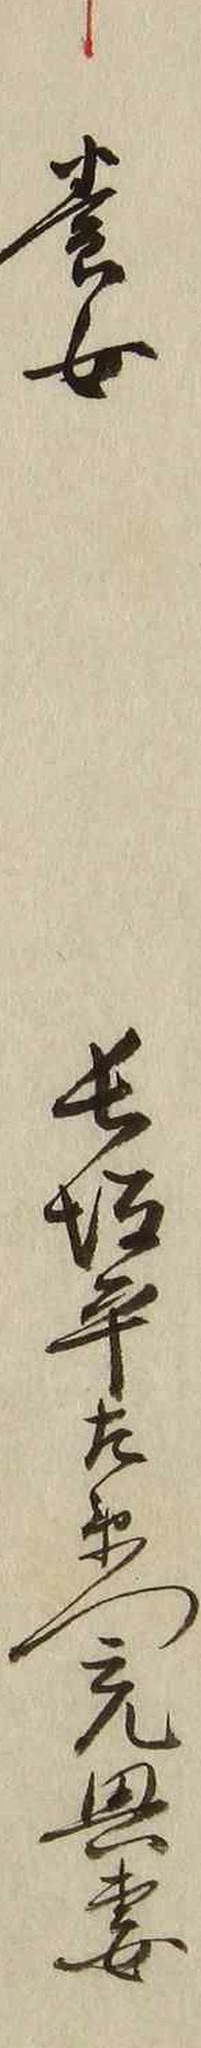養女長垣平左衛門充興妻
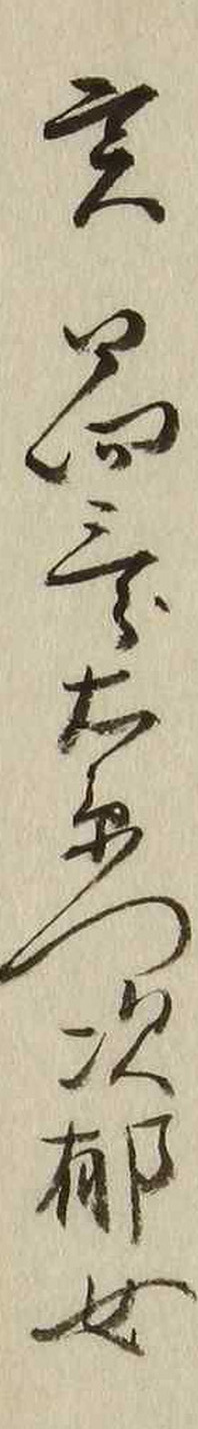実日向三郎右衛門次郁女
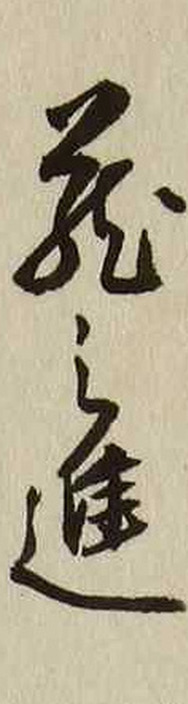蔵之進
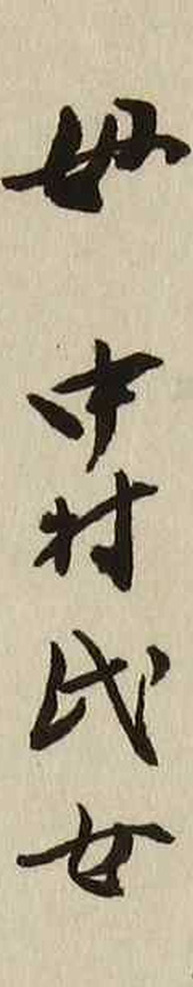母中村氏女
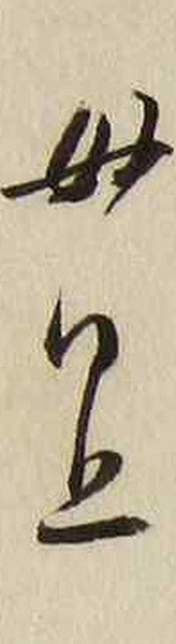母同上

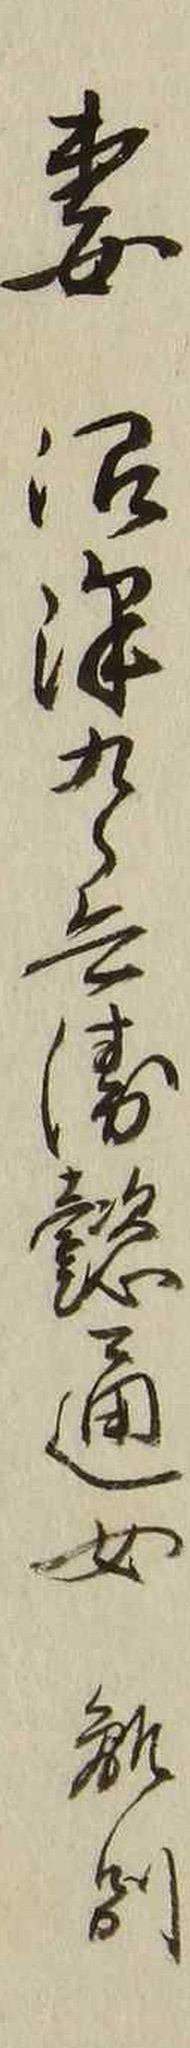妻沼沢九兵衛懿通女離別
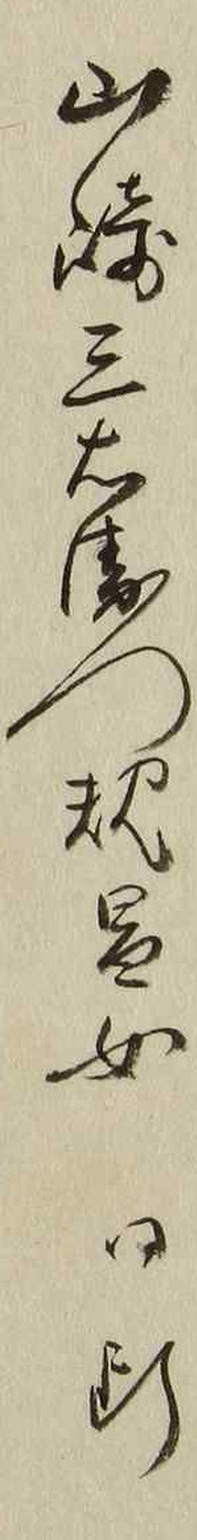山崎三右衛門規昌女同断
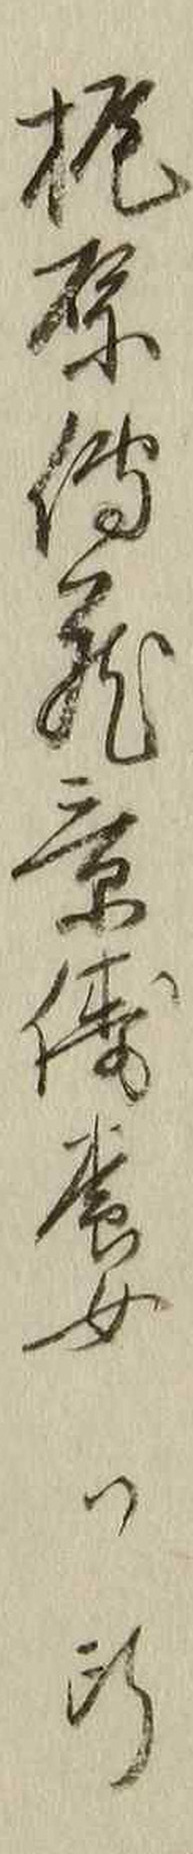梶原伝蔵景儔養女同断
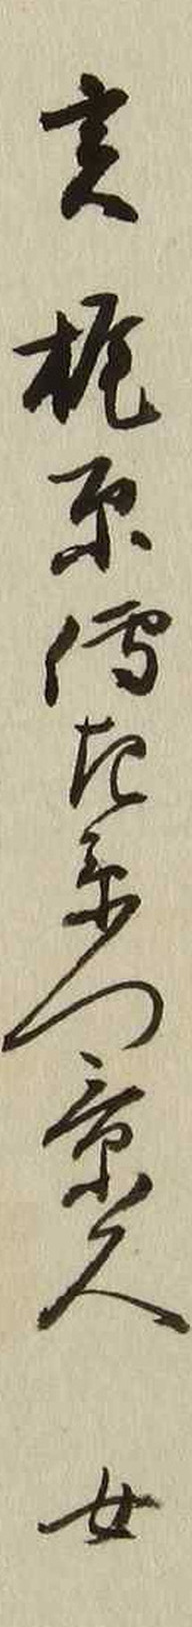実梶原伝左衛門景人女
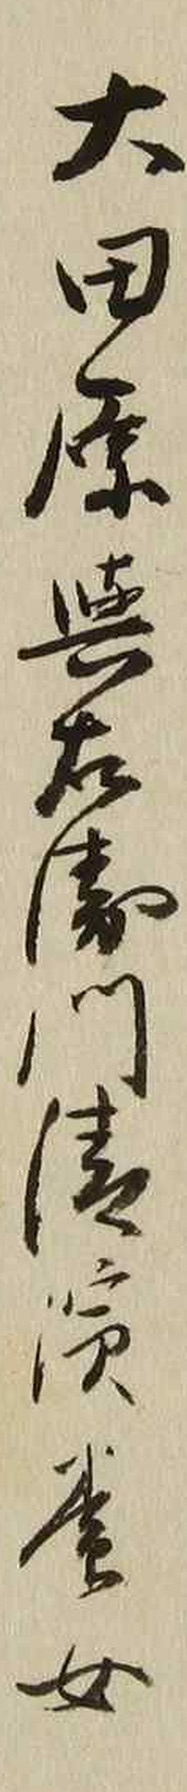大田原輿右衛門清濱養女
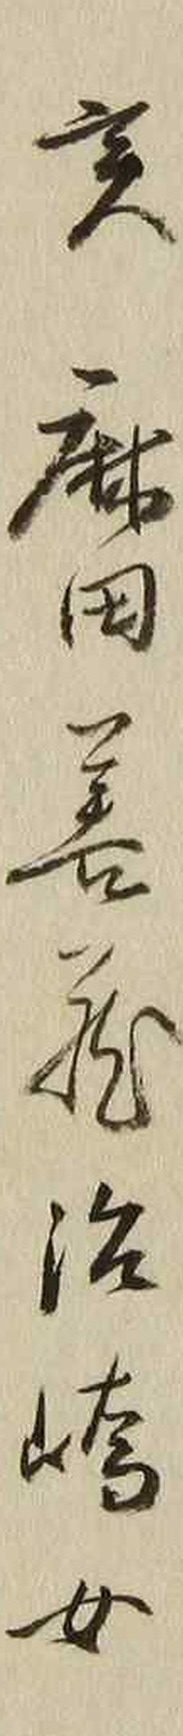実麻田善蔵治嶋女
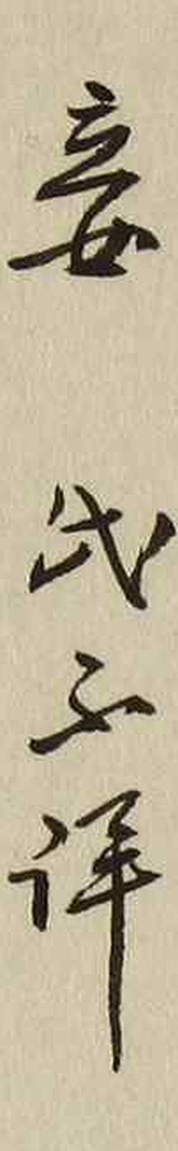妾氏不詳
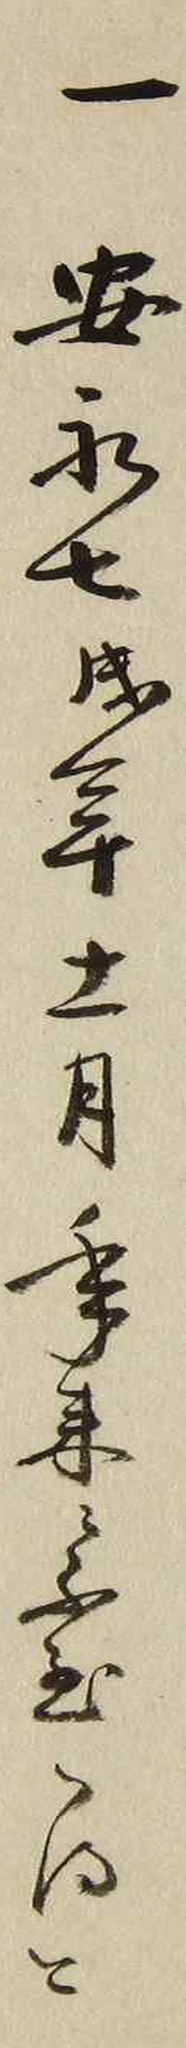一安永七戌年十一月年来に不至候得と
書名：諸士系譜　巻之292　き之部1
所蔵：会津若松市立会津図書館
